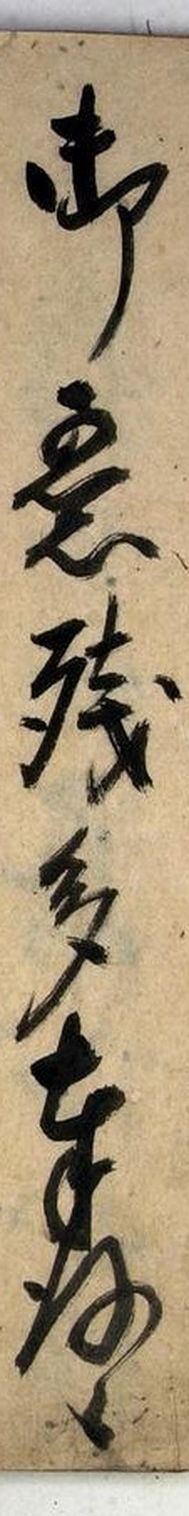御意残多奉存候
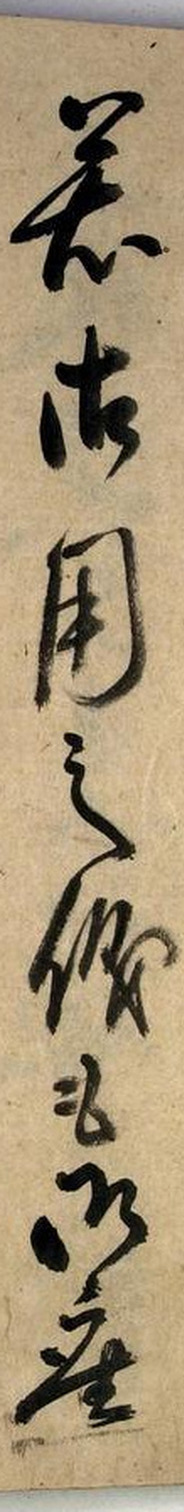若御用之儀も御座
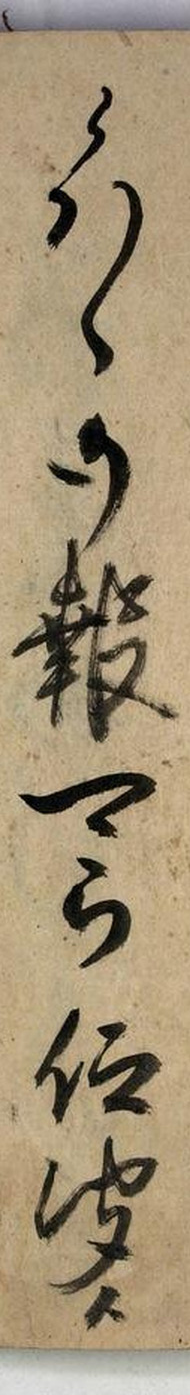候ハゝ御報可被仰聞候
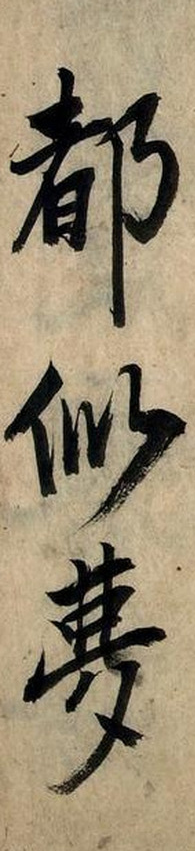都似夢

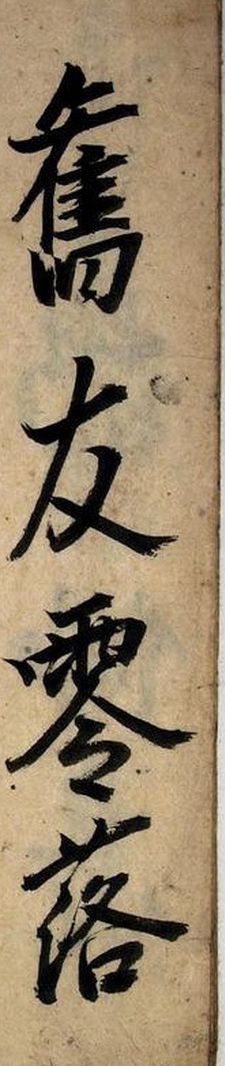旧友零落
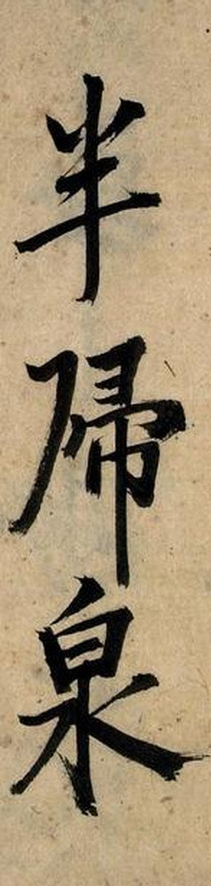半帰泉
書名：御手本（手習、小川浦大網に鯨掛り生捕候由ニ付）
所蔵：福井県文書館 Fukui Prefectural Archives
